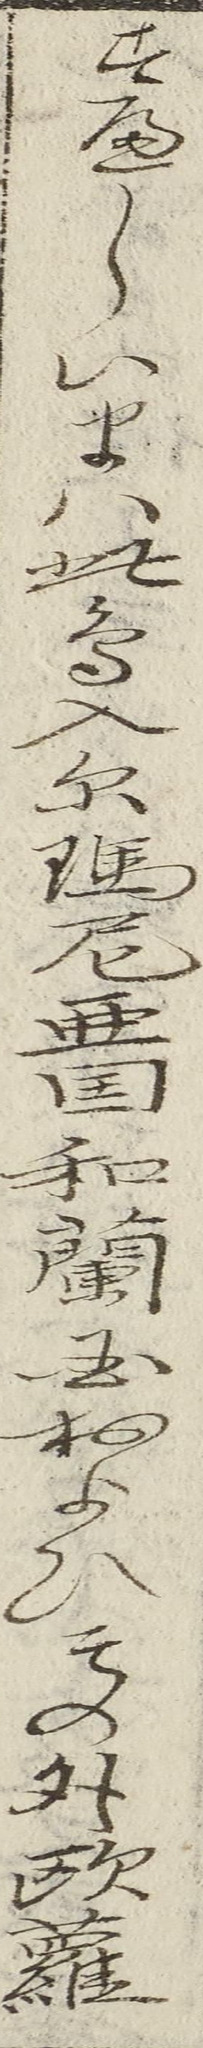すへしいまハ此鳥入尓尼亜国和蘭国およひその外欧蘿
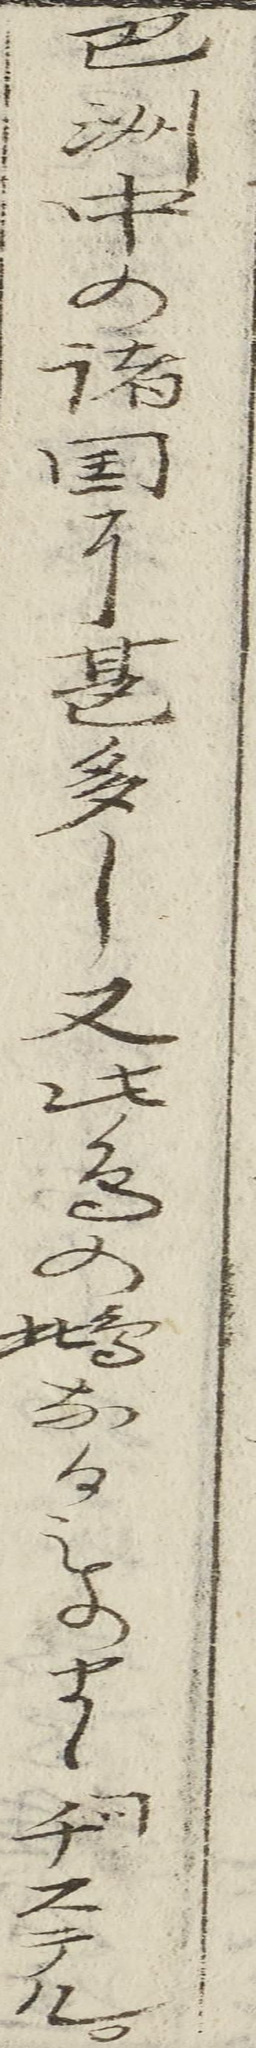巴州中の諸国に甚多し又此鳥の囀なるものまに「ヂステル。

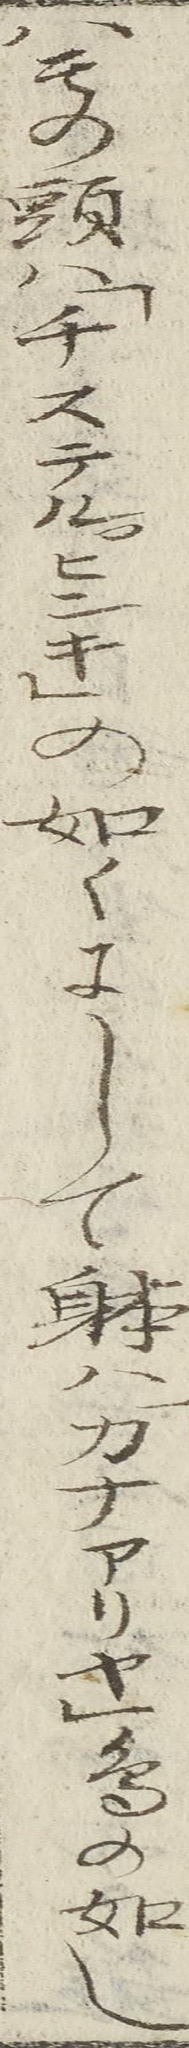ハその頭ハ「チステル。ヒンキ」の如くにして体ハ「カナアリヤ」鳥の如し
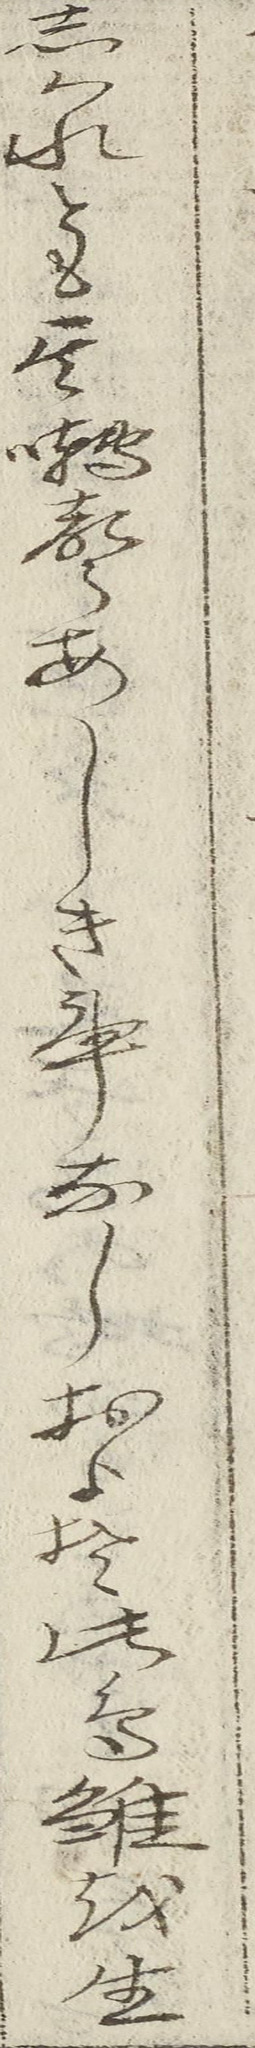しかれとも其囀声あしき事なしおよそ此鳥雛を生
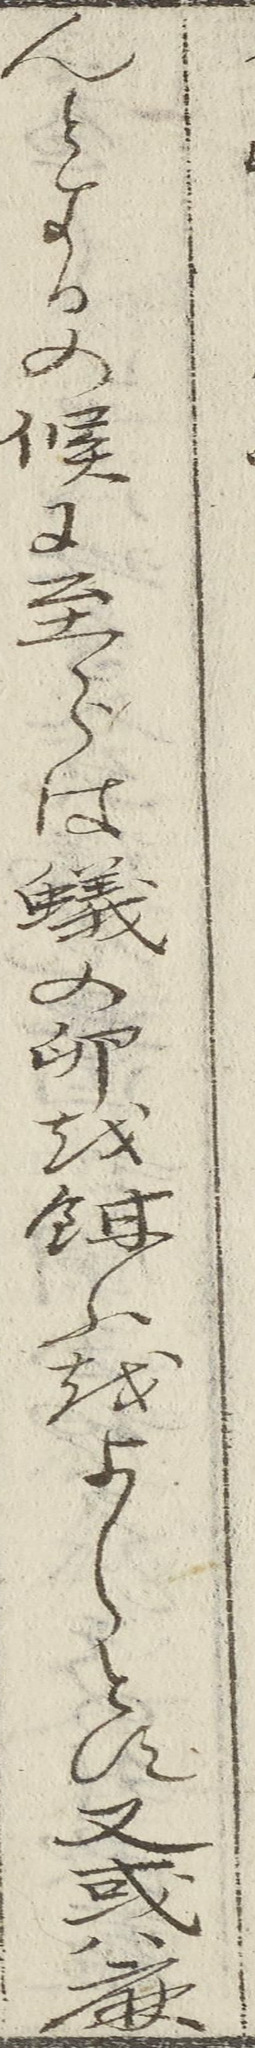んとするの候に至らは蟻の卵を餌ふをよしとす又或ハ廉
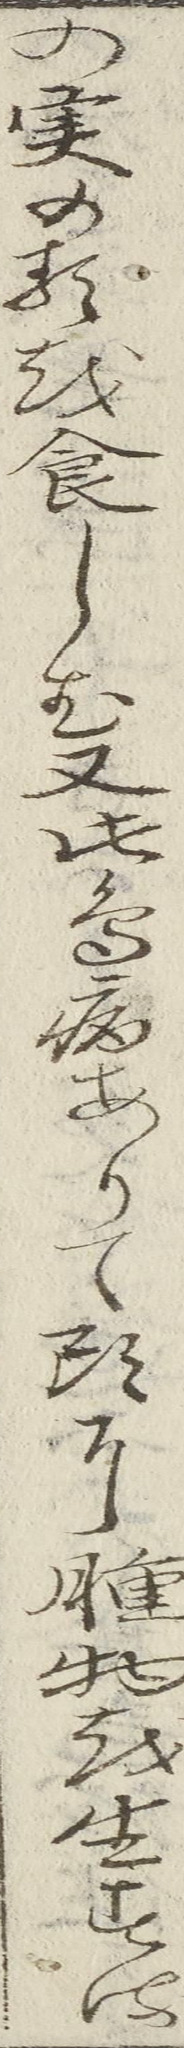の実の類を食しむ又此鳥病ありて既に腫物を生する
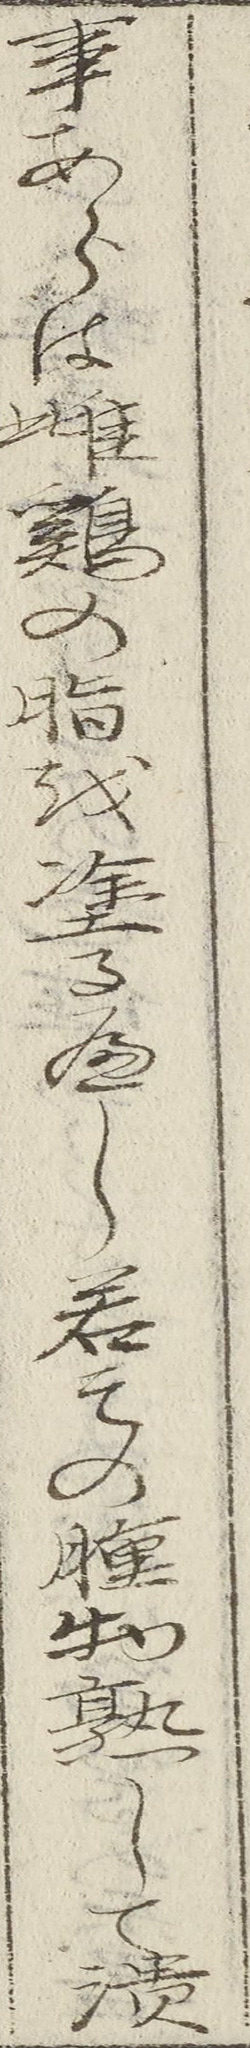事あらは雌鶏の脂を塗るへし若その腫物熟して潰れ
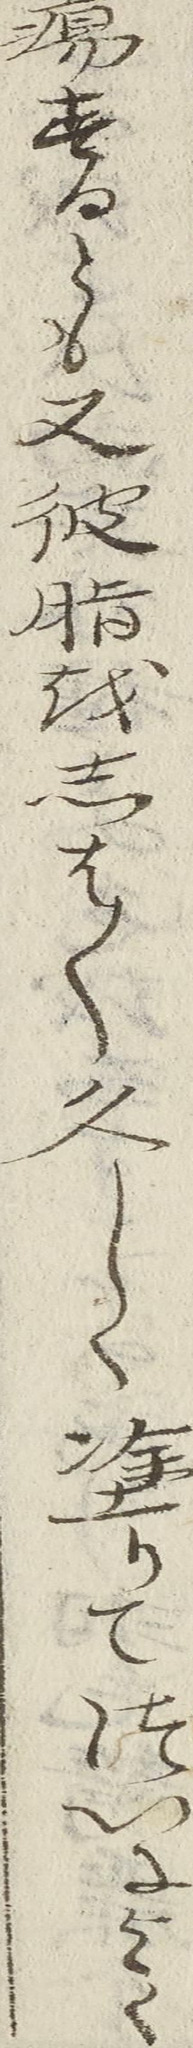傷するとも又彼をしは〳〵久しく塗りてついによく
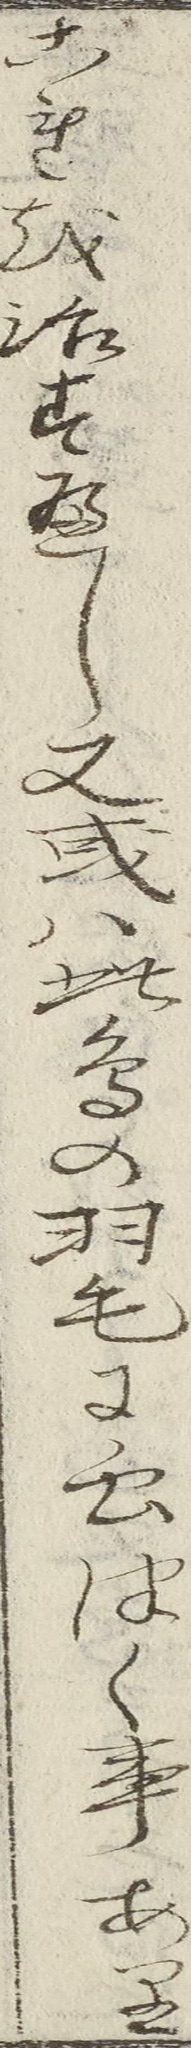これを治すへし又或ハ此鳥の羽毛に虫つく事あり
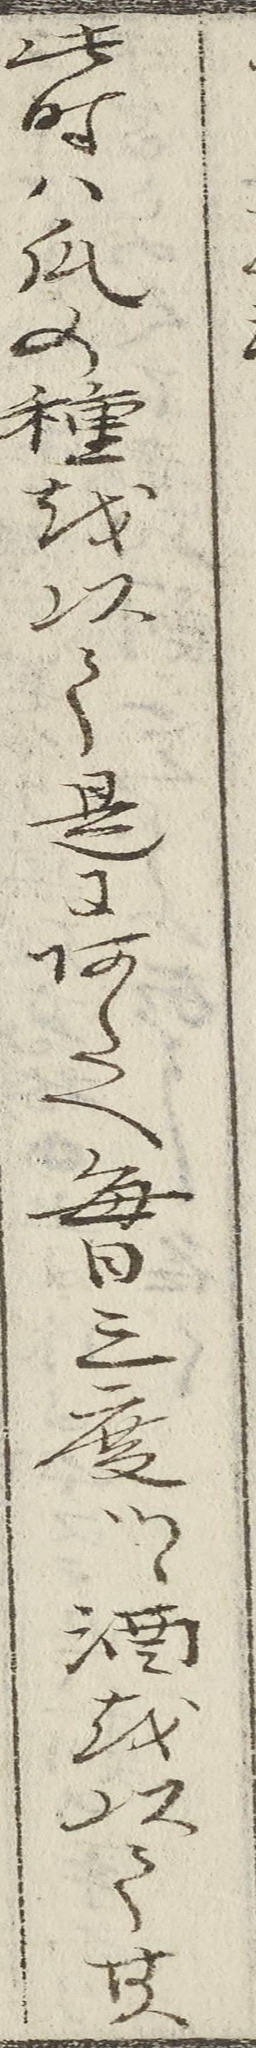此時ハ瓜の種を以て是にあたへ毎日三度ツゝ酒を以て其
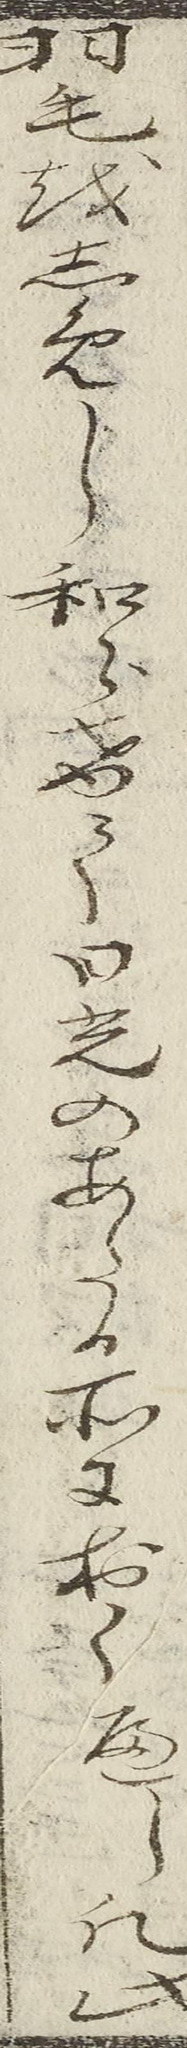羽毛をしめし和らけて日光のあたる所におくへし凡此
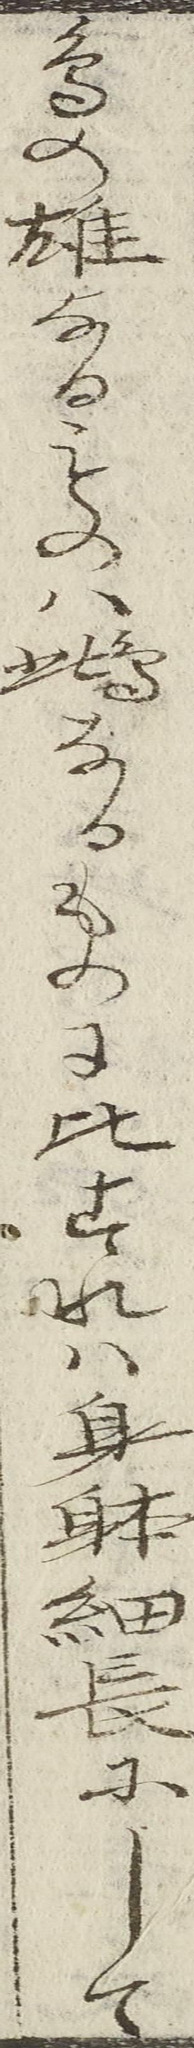鳥の雄なるものハ囀なるものに比すれハ身体細長にして
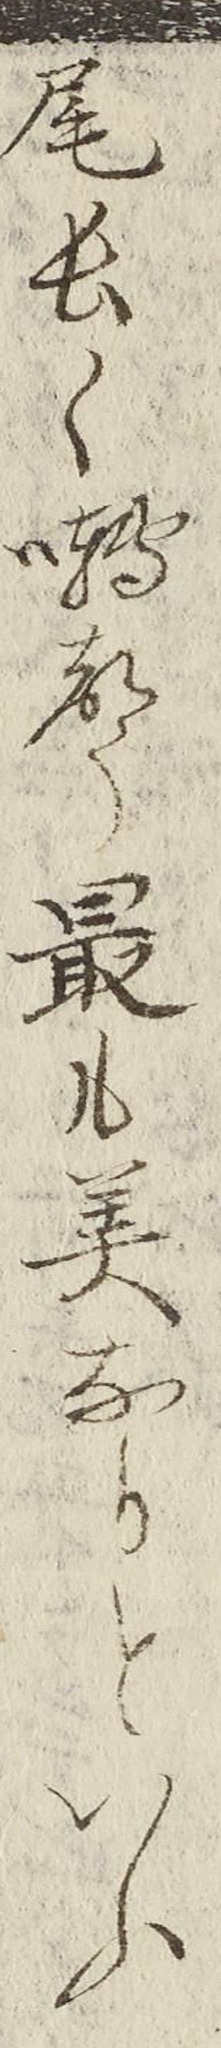尾長く囀声最も美なりといふ
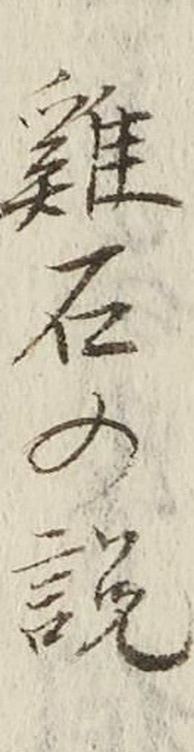雞石の説
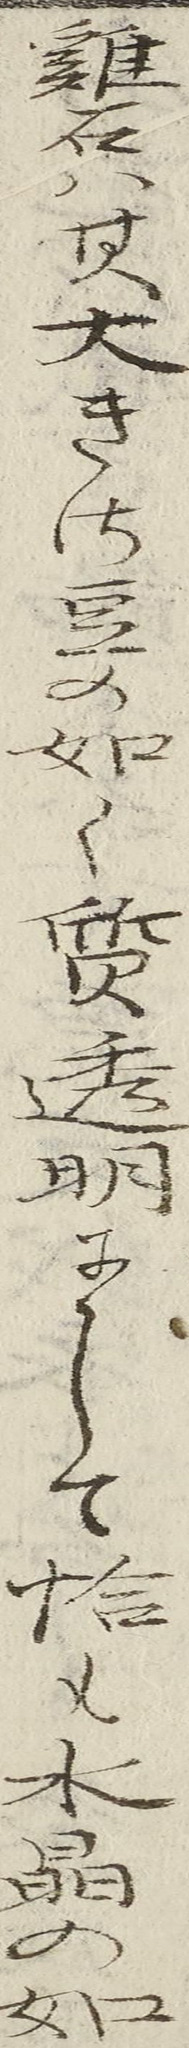雞石は其大きさ豆の如く質透明にして恰も水晶の如
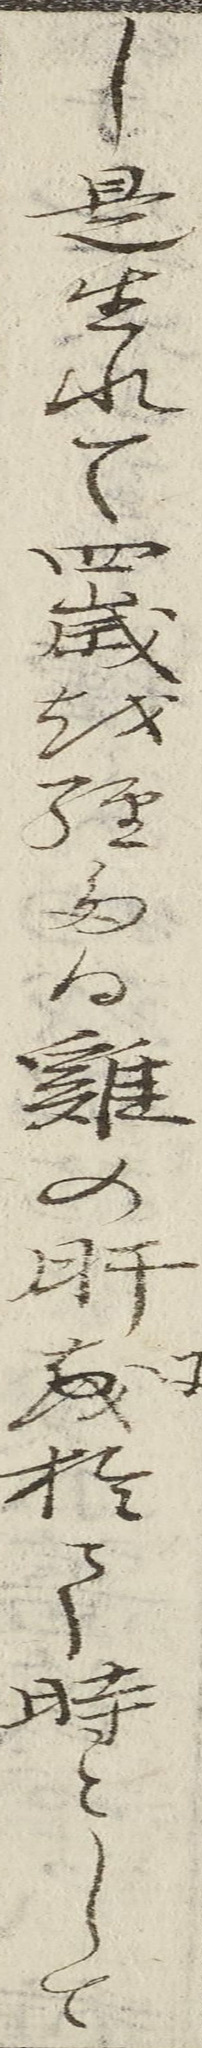し是生れて四歳を経たる雞の肝に於て時として
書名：西洋雜記　坤
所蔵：東京大学地震研究所図書室 Earthquake Research Institute Library, The University of Tokyo, JAPAN
